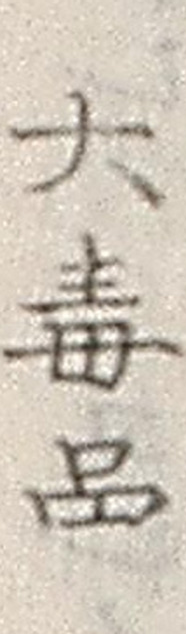大毒品
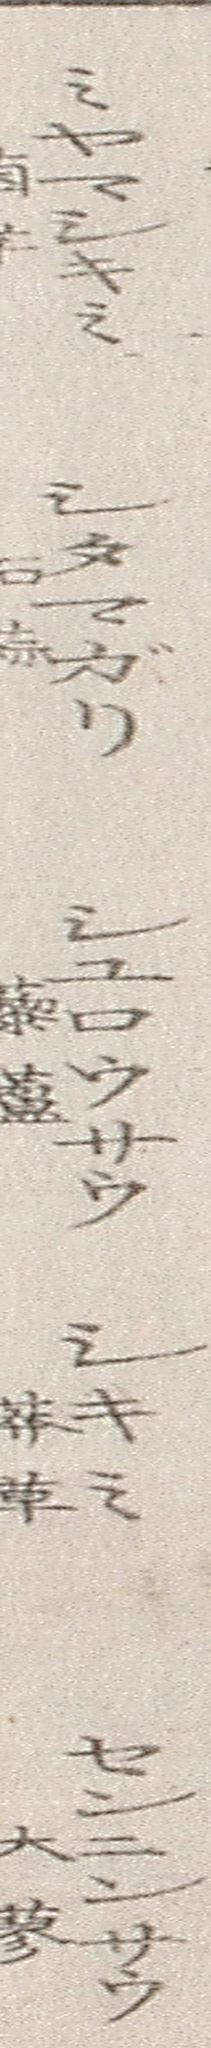ミヤマシキミシタマガリシユロウサウシキミセンニンサウ
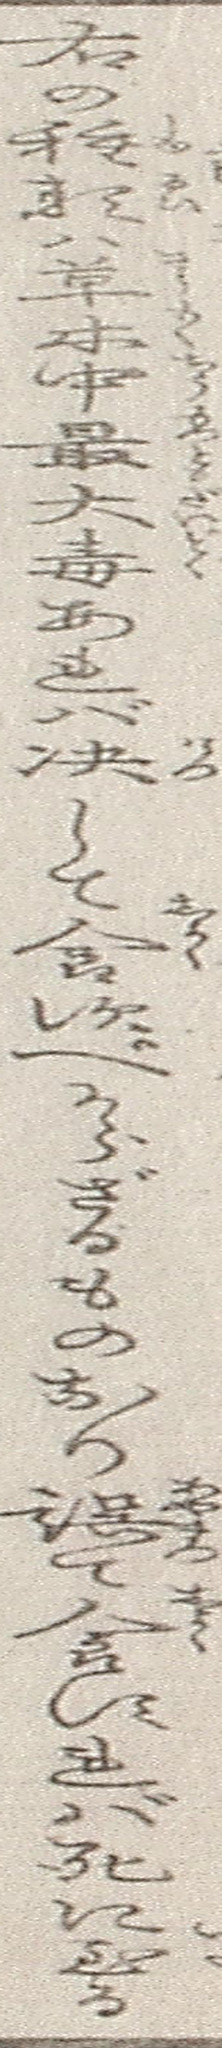右の種類は草木中最大毒あれば决して食すべからざるものなり誤て食すれば死に至る

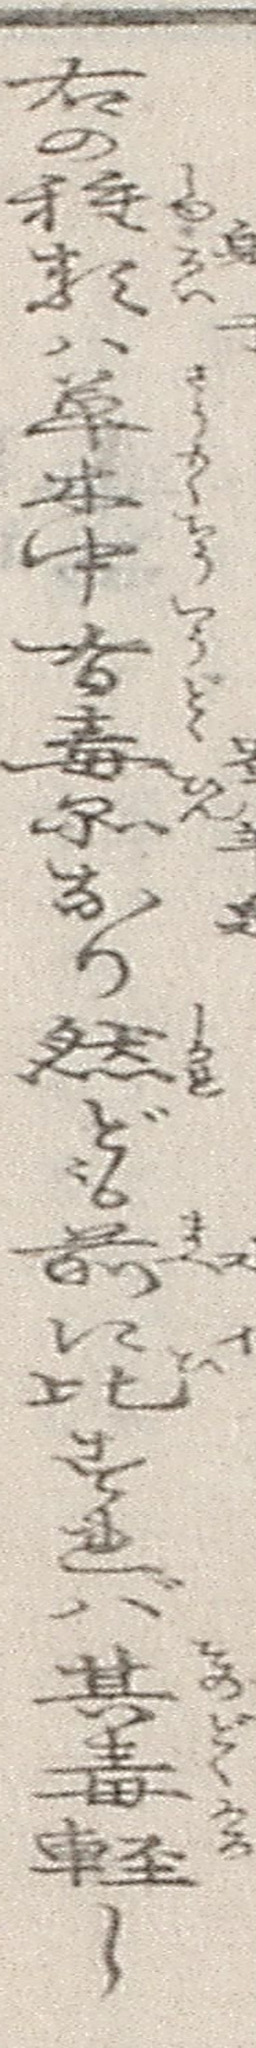右の種類は草木中有毒品なり然ども前に比すれば其毒軽し
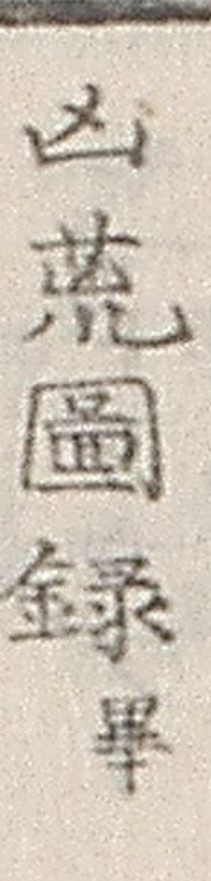凶荒図録畢
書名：凶荒図録　完
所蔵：東京大学地震研究所図書室 Earthquake Research Institute Library, The University of Tokyo, JAPAN
